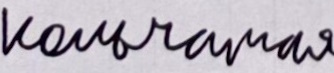кольчатая
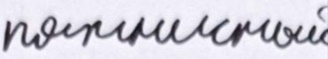пятнистый
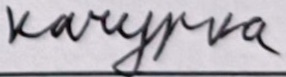качурка
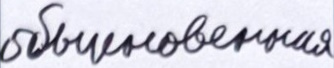обыкновенная
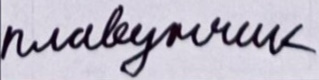плавунчик
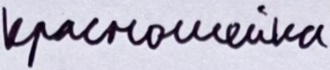красношейка
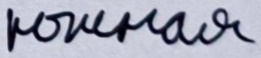южная
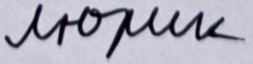люрик
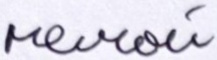немой
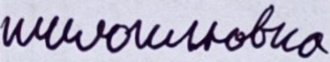шилоклювка
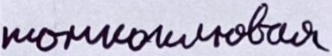тонкоклювая
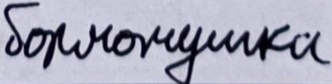бормотушка
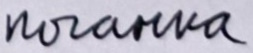поганка
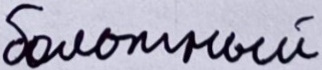болотный
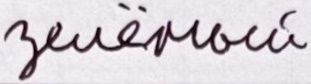зелёный
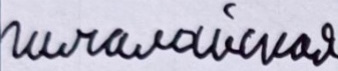гималайская
